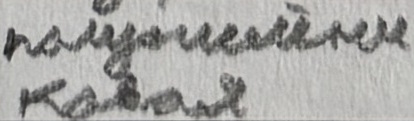полуошейниковая
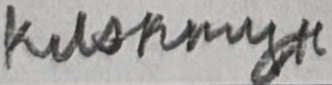клоктун
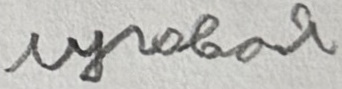луговая
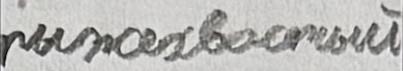рыжехвостый
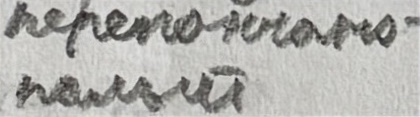перепончато-палый
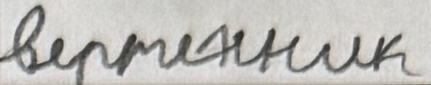вертенник
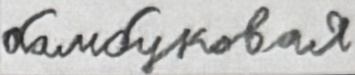бамбуковая
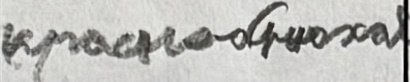краснобрюхая
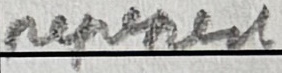перепел
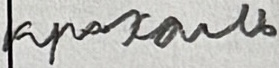крохаль
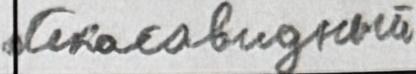бекасавидный
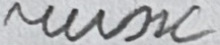чиж
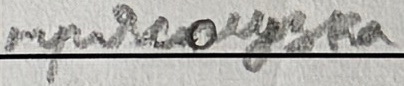трясогузка
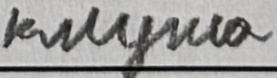клуша
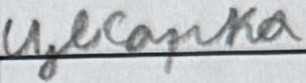цесарка
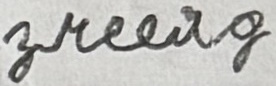змееяд
